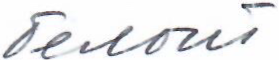белый
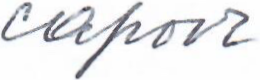сарыч
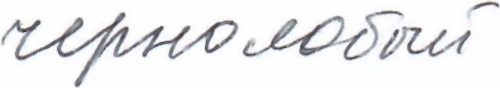чернолобый
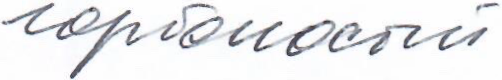горбоносый
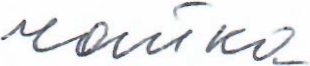чайка
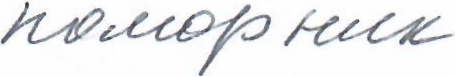поморник
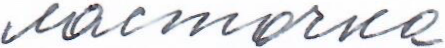ласточка
